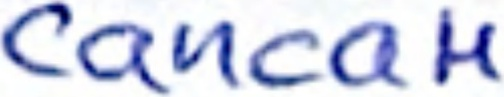сапсан
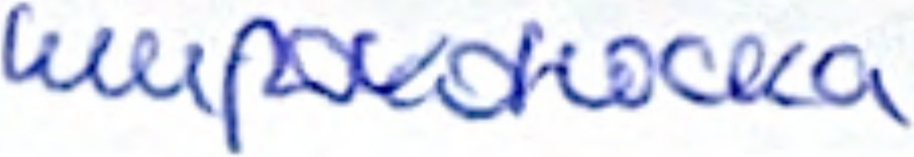широконоска
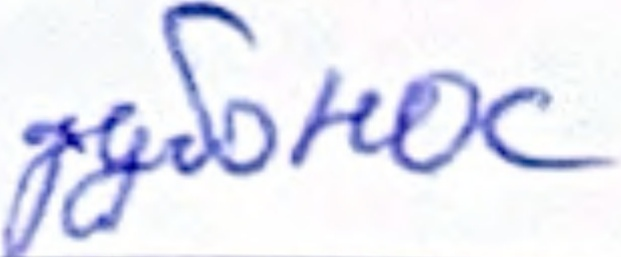дубонос
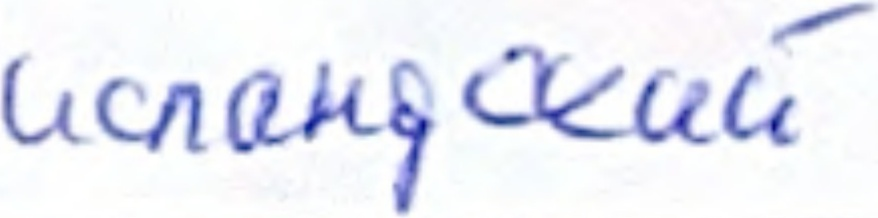исландский
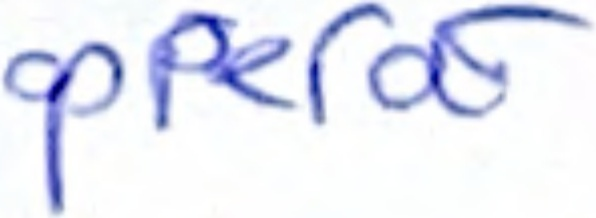фрегат
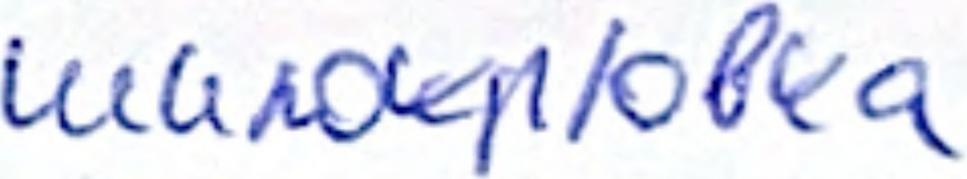шилоклювка
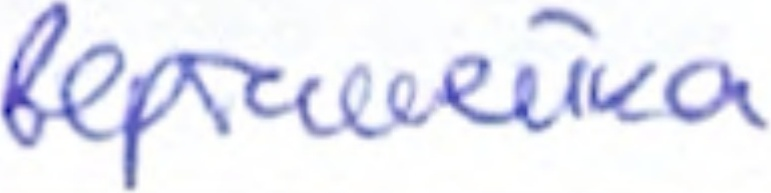вертишейка
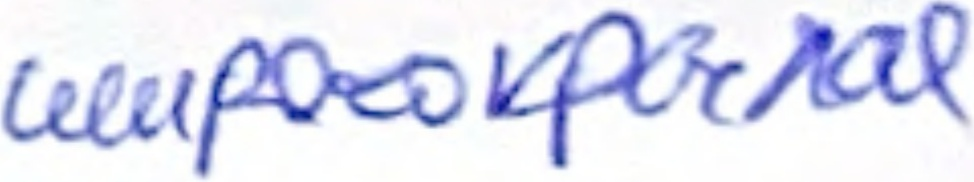ширококрылая
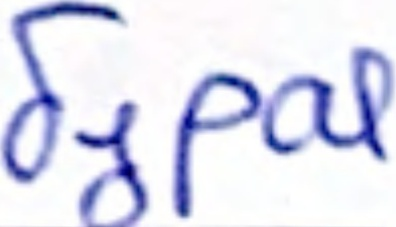бурая
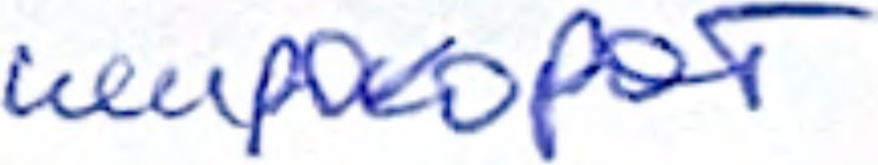широкорот
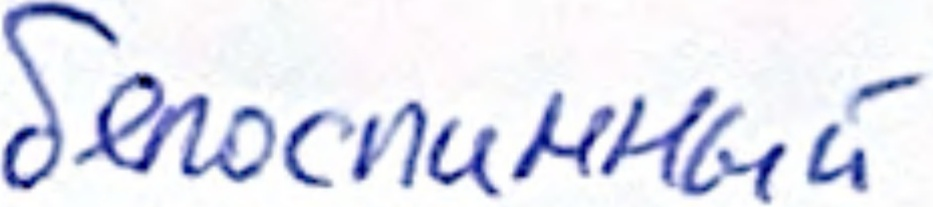белоспинный
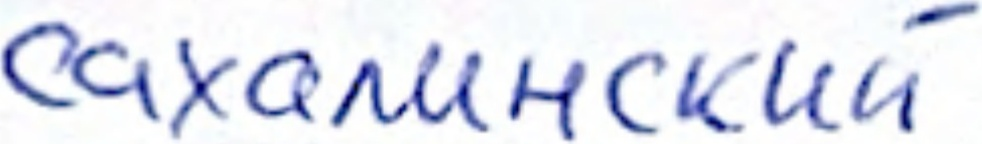сахалинский
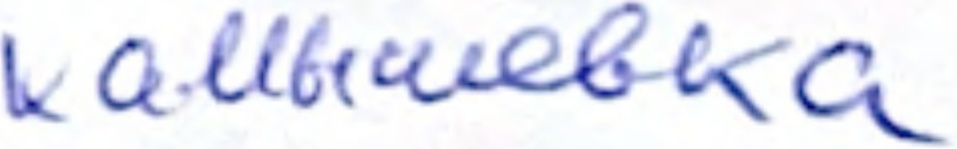камышевка
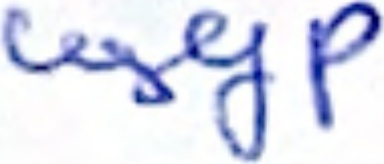щур
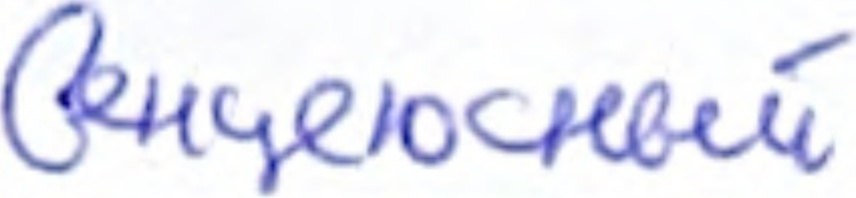венценосный
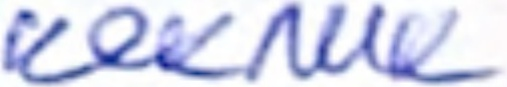кеклик
